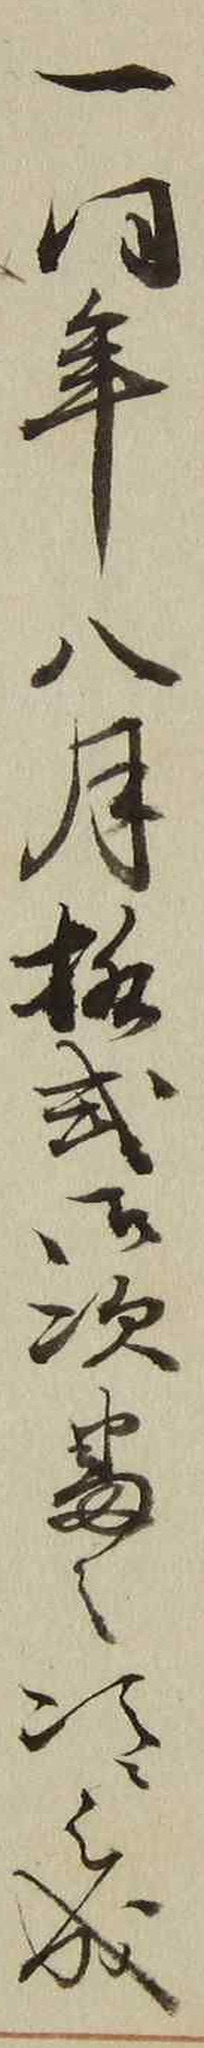一同年八月格式御次番之次ニ被成
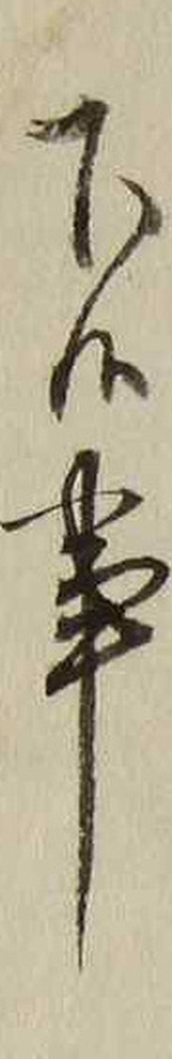下候事
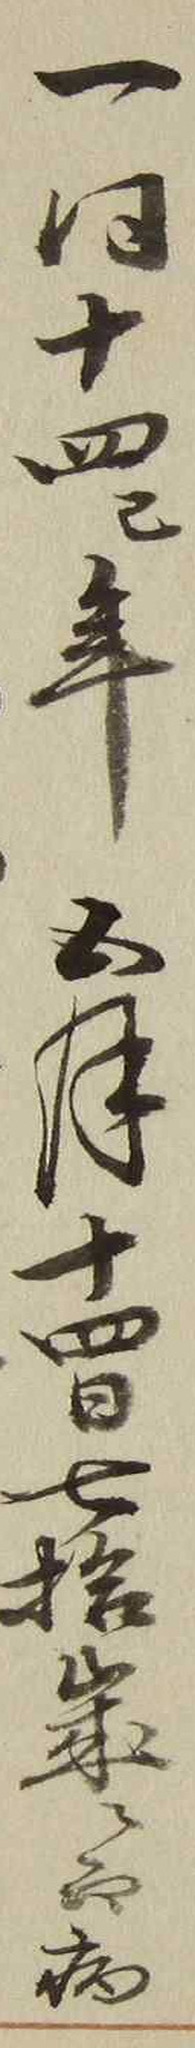一同十四巳年五月十四日七拾歳ニ而病
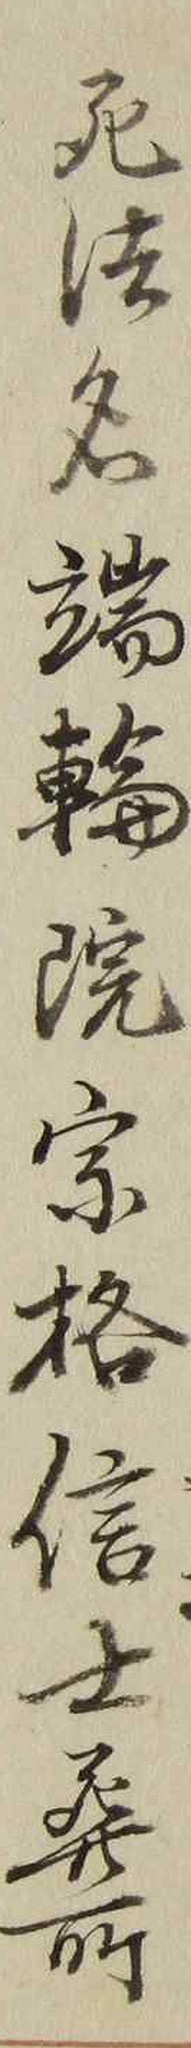死法名端輪院宗格信士葬所

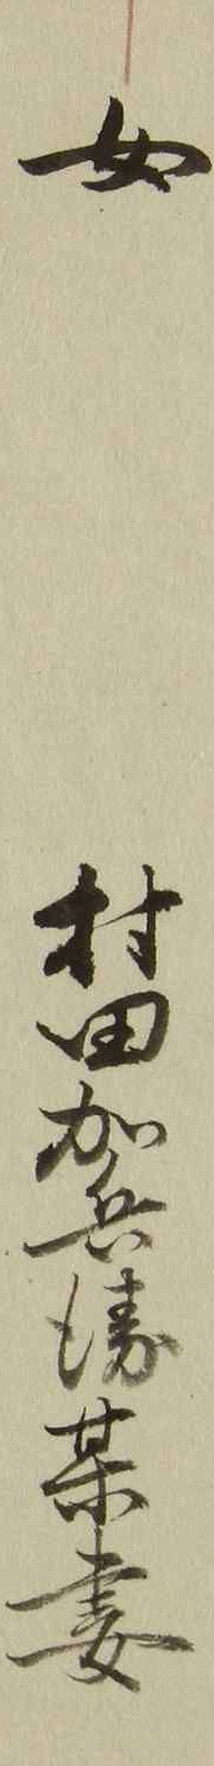女村田加兵衛某妻
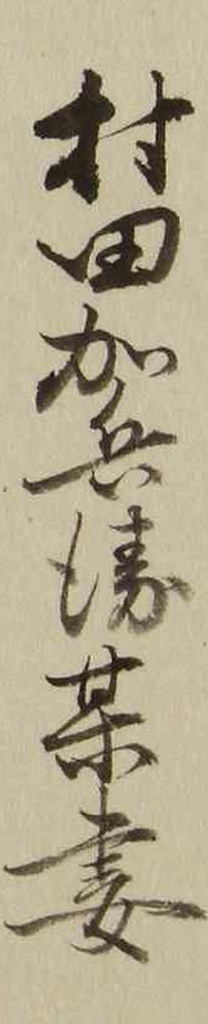女村田加兵衛某妻
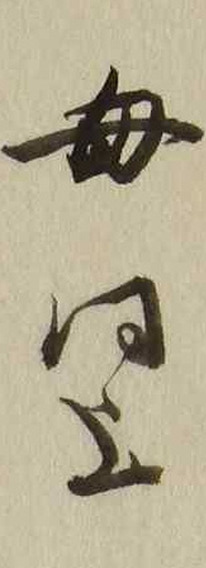母同上
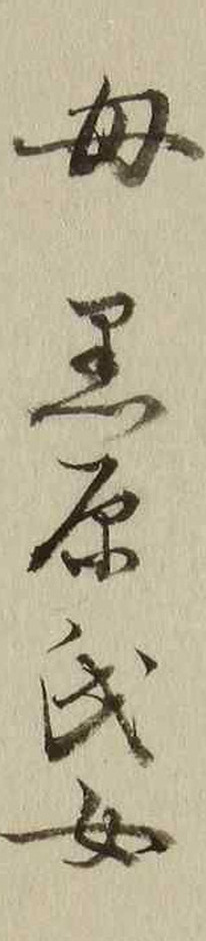母黒原氏女
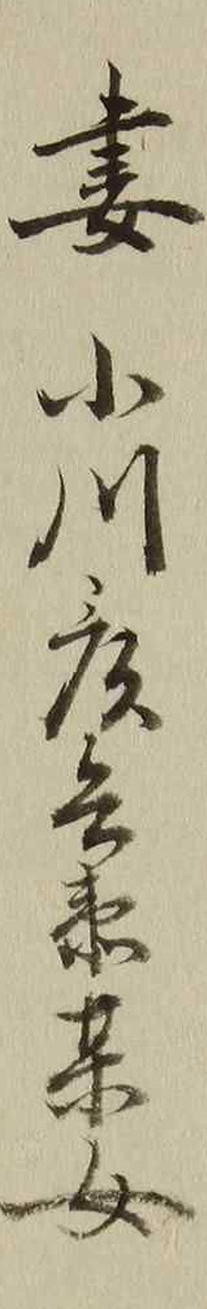妻小川彦兵衛某女
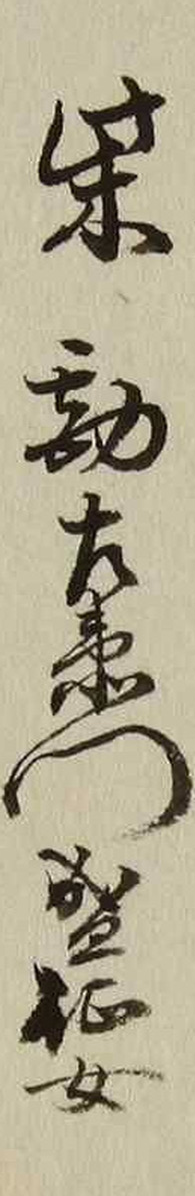柴勘左衛門盛柾女
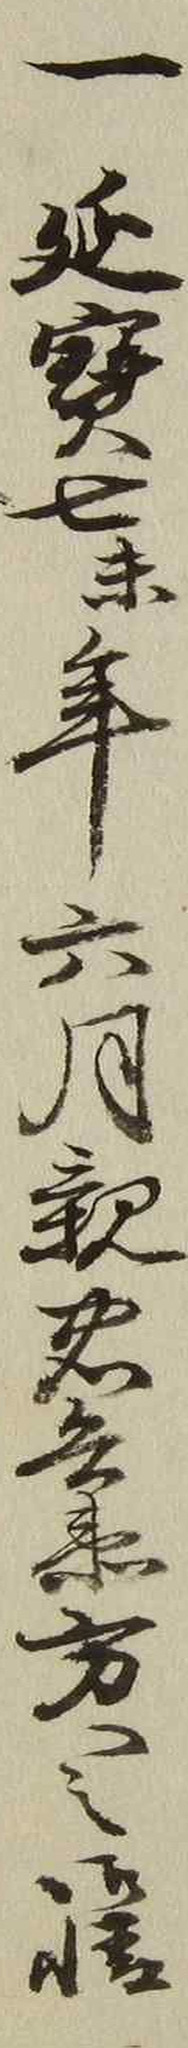一延宝七未年六月親忠兵衛方へ之御情
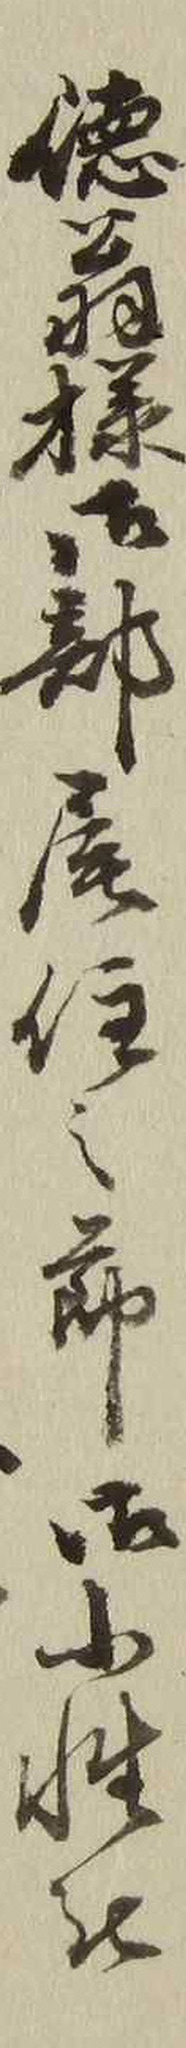徳翁様御部屋住之節御小性被
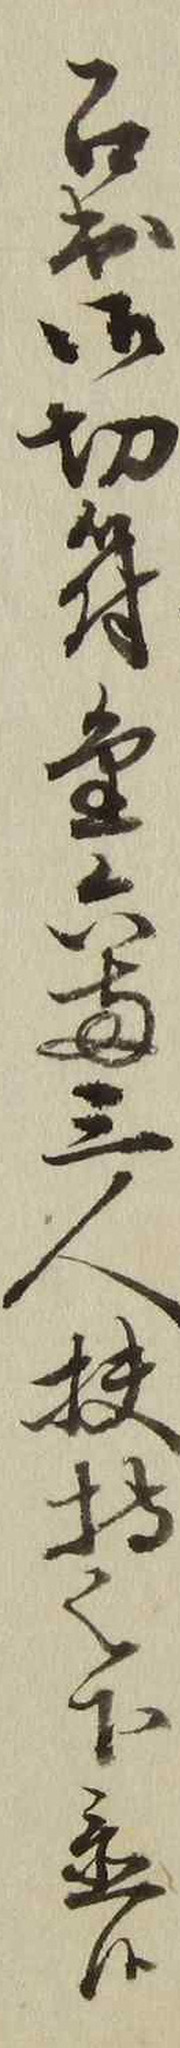召出御切符金六両三人扶持被下置候
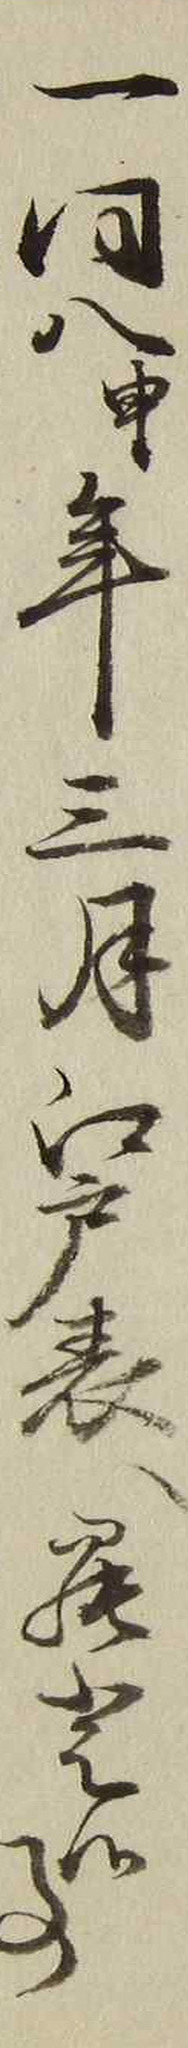一同八申年三月江戸表へ罷登候事
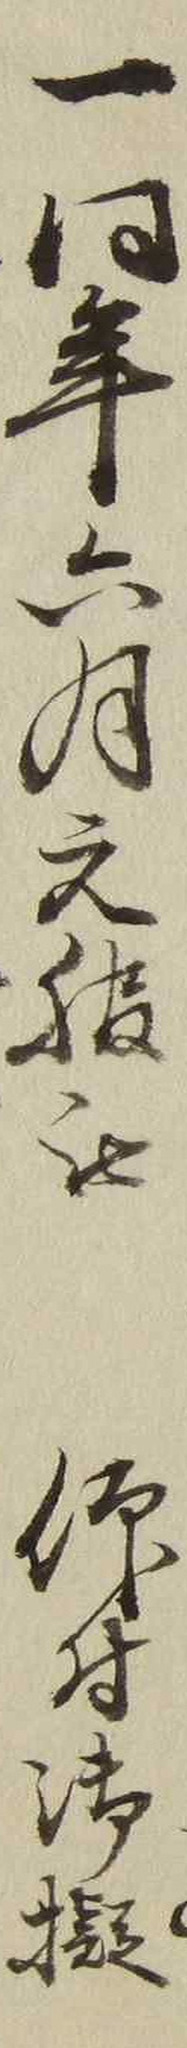一同年六月元服被仰付御擬
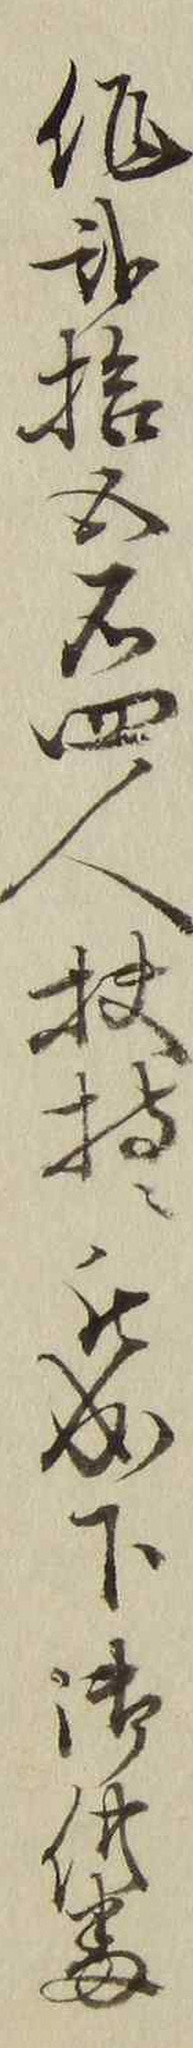作弐拾五石四人扶持ニ被成下御供番
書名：諸士系譜　巻之36　は之部4
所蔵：会津若松市立会津図書館
